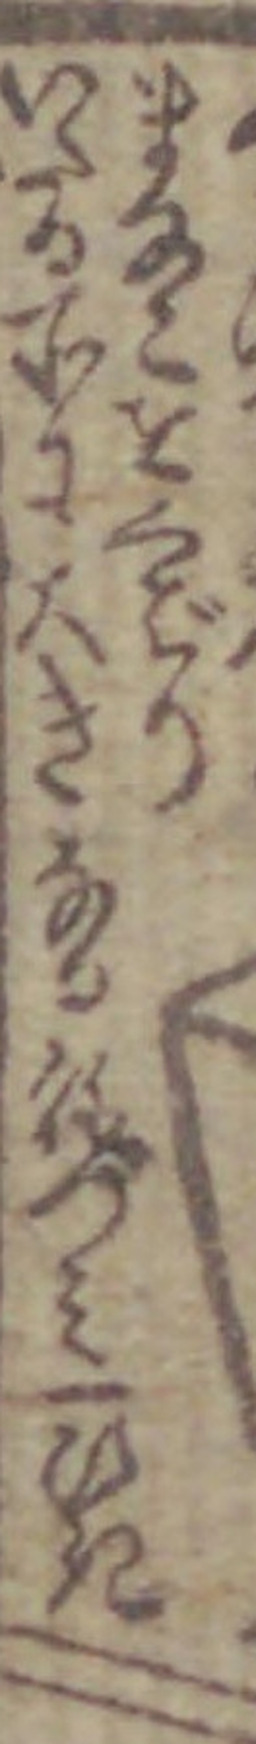いたる所に大きなるねづみ一ひき
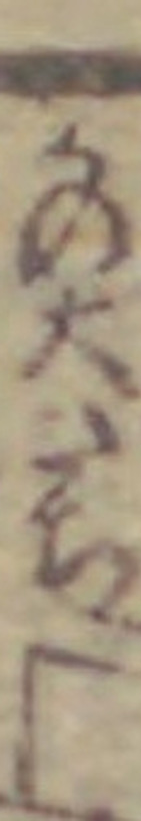かの大だち
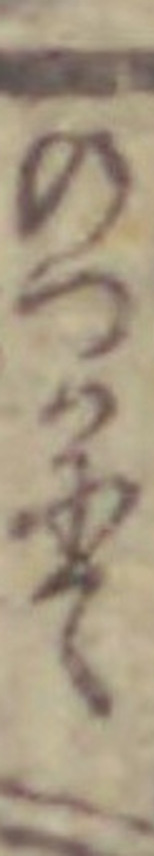のつかにて
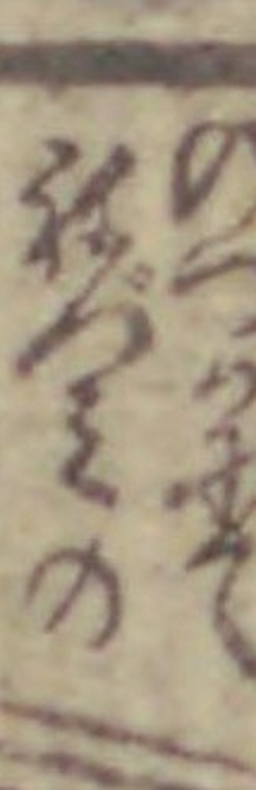ねづみの
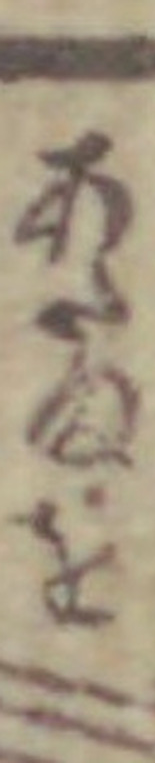あたまを
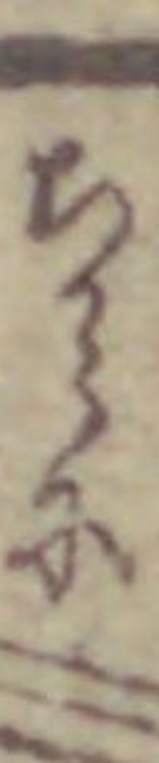ちからに
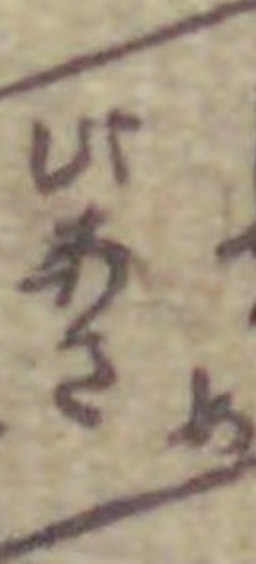此あさ
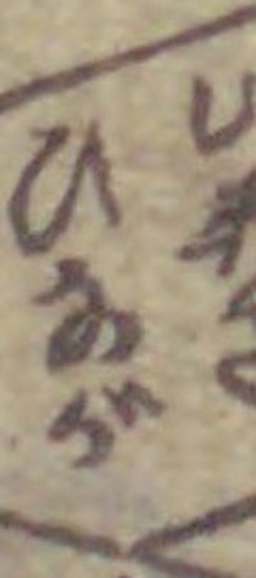ひなが
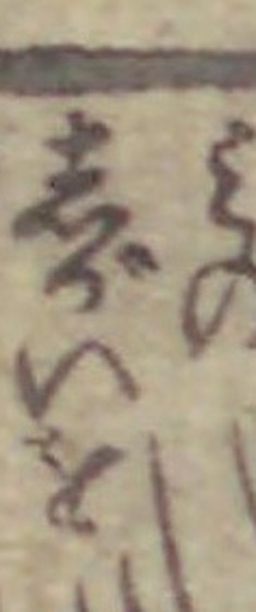しがいを
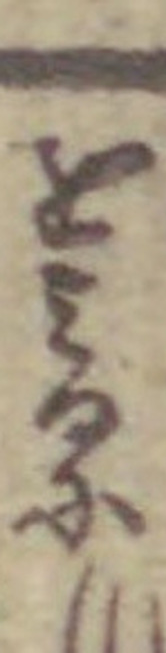をみるに
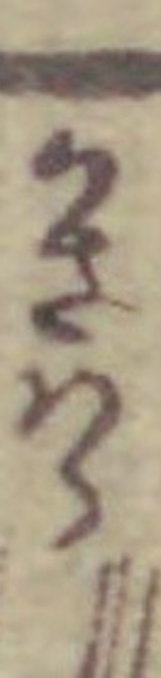かさはら
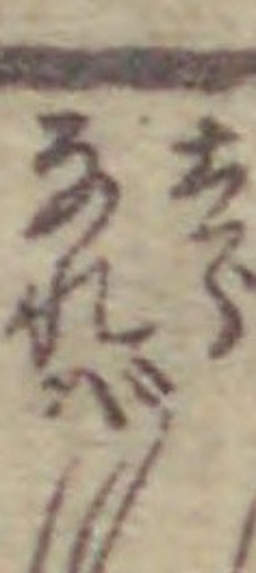なれば
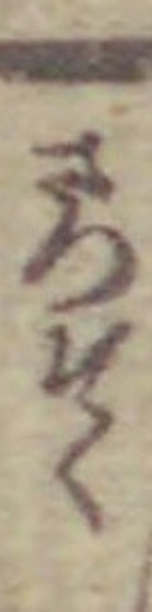さつそく
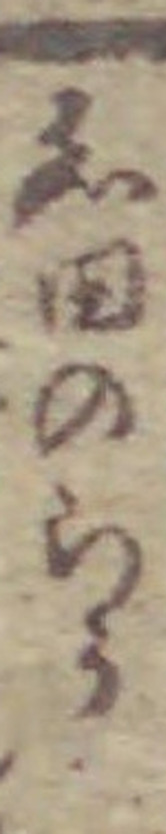和田のらう
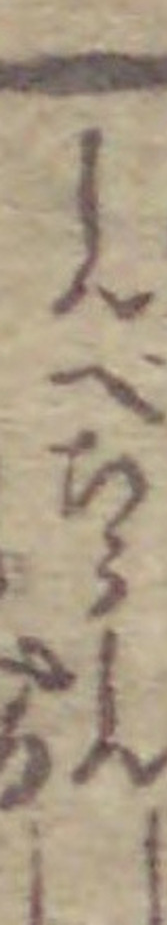しんへちうしん

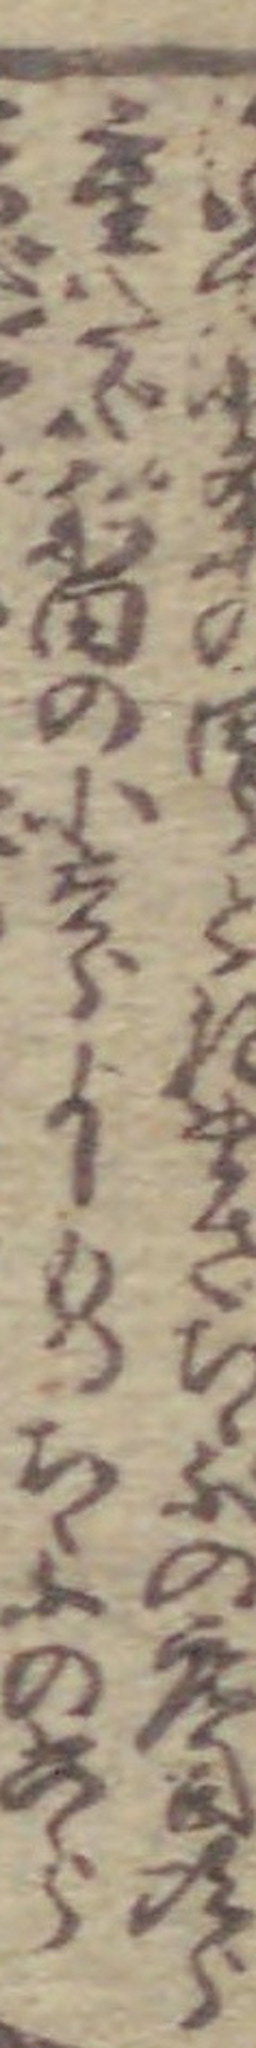重たゞ和田の小太郎よしもりちゝふの六郎
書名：鎌倉山紅葉浮名
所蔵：国立国会図書館 National Diet Library, JAPAN
